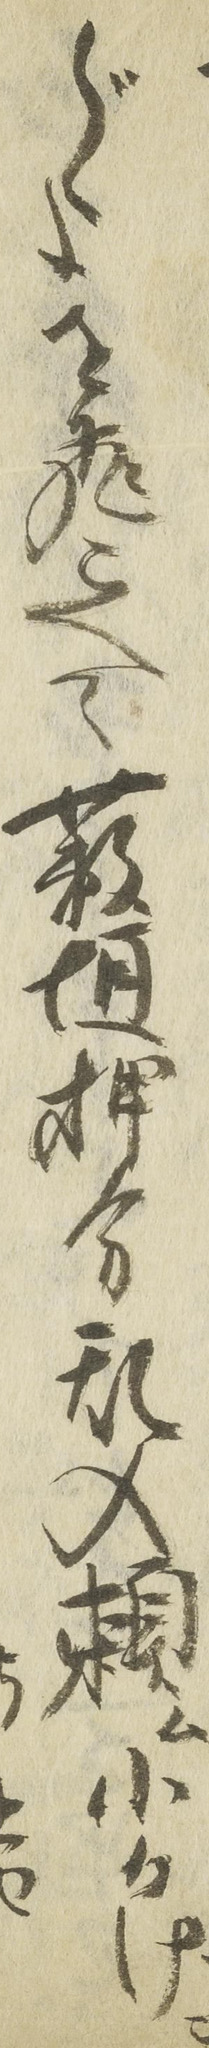じよを飛こへて薮垣押分乱入頼ム小かげニ
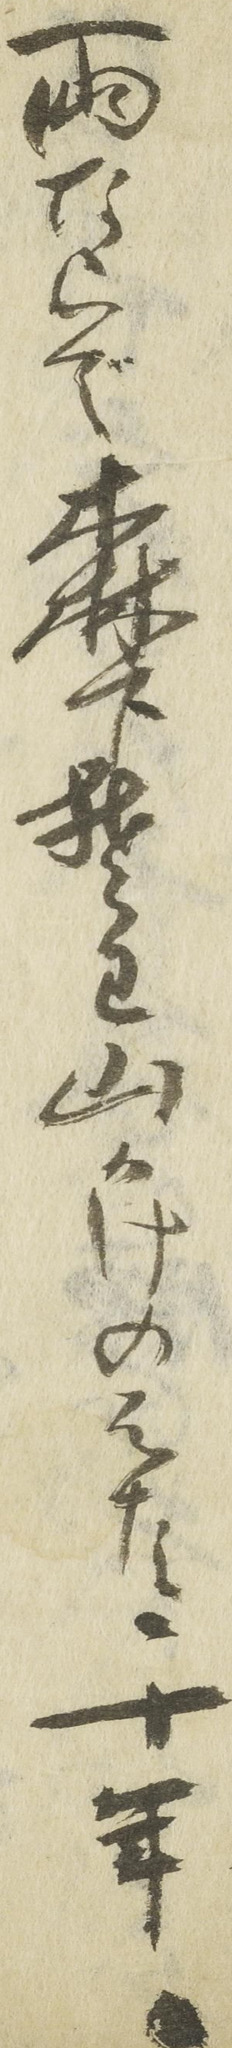雨ならで森下そわ山かけのはた千年
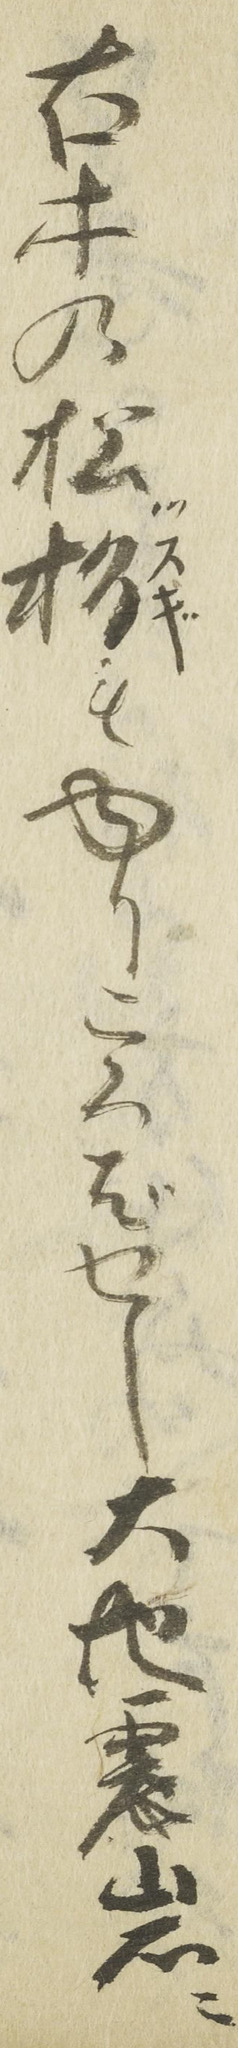古木の松ツ杉もゆりころばせし大地震岩ニ
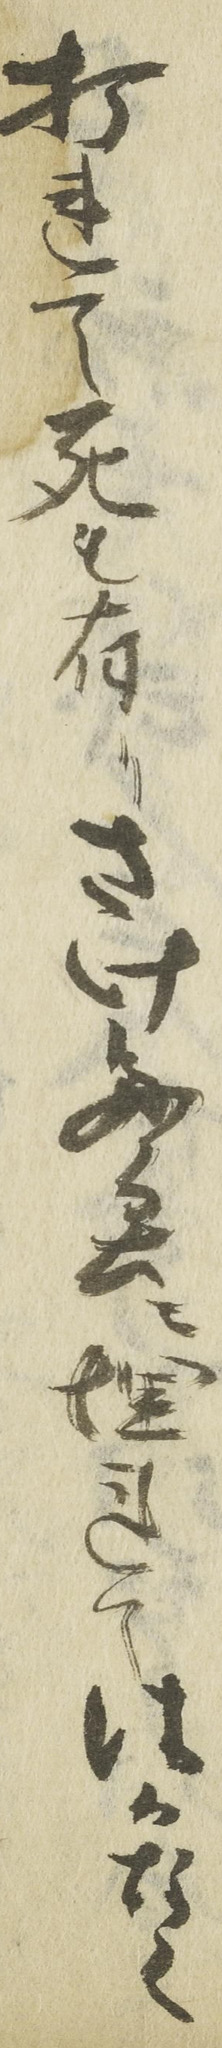打れて死も有りさけたる土ニ埋れてはかなく
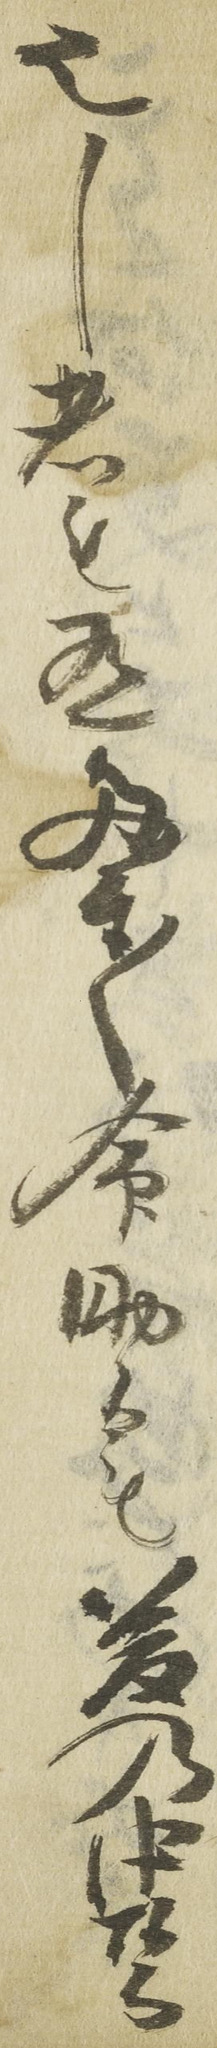也し者も有たま〳〵命助るも夢の中なる
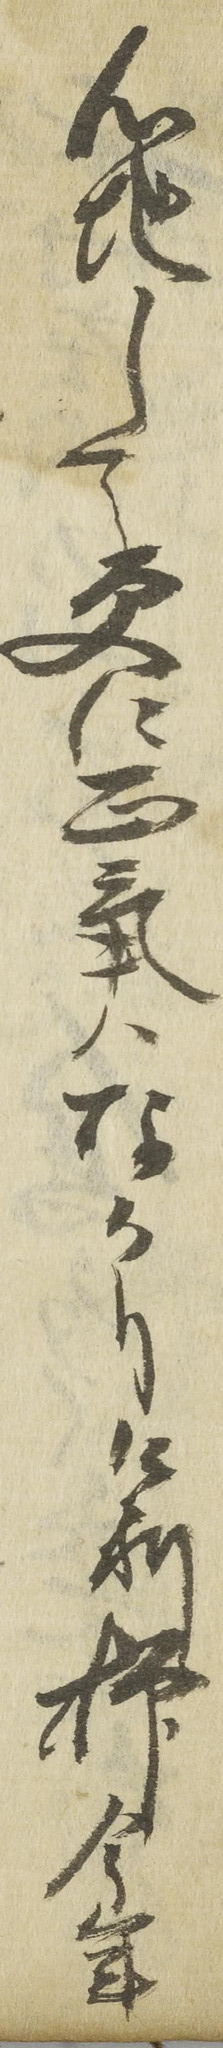心地して更に正気はなかりけり抑今年
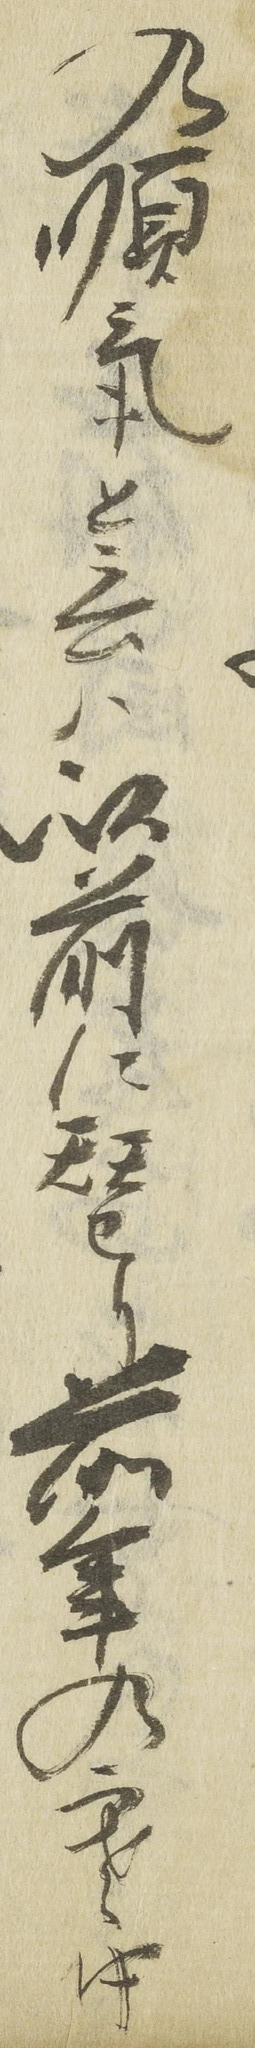の順気と言は以前に替り前年の寒中
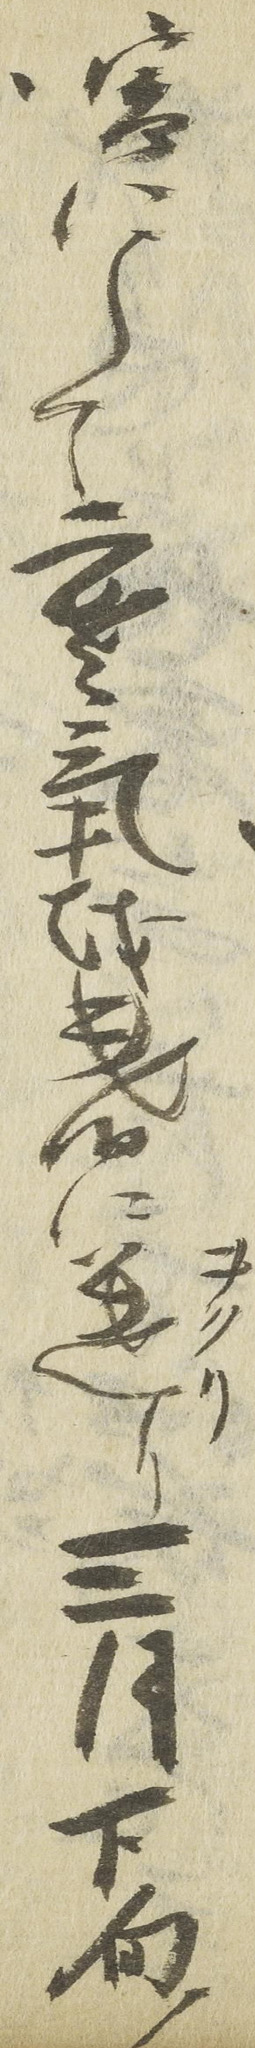喧にして寒気を春に送り三月下旬の
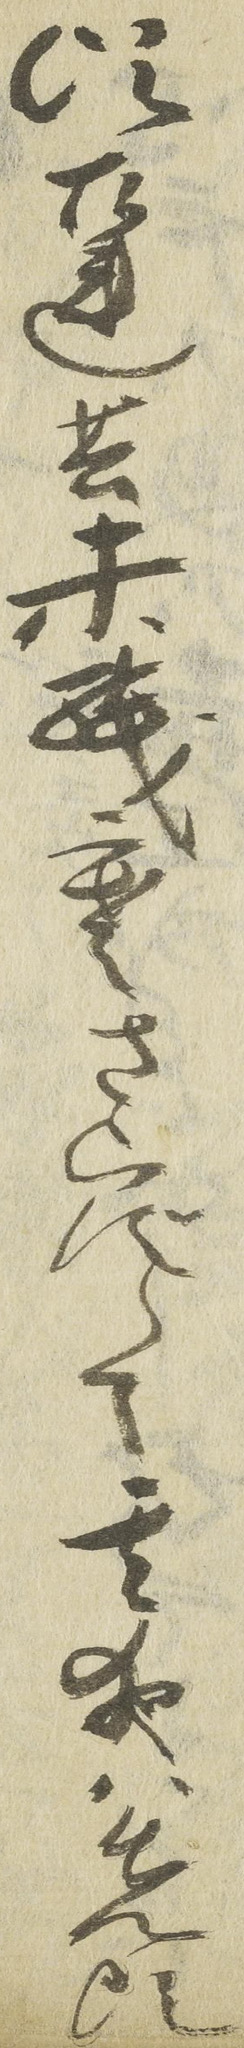頃なれ共未残寒さらずして其夜は先頃
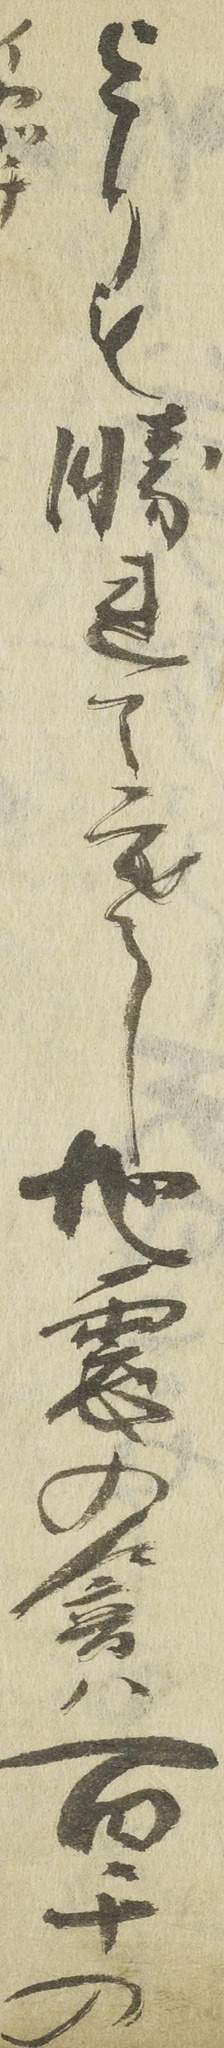よりも勝れて寒し地震の響は百千の
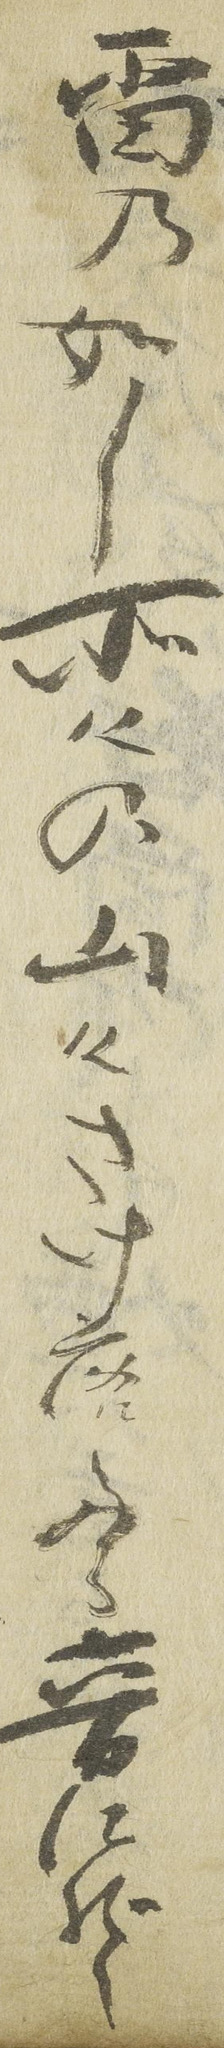雷の如く所々の山々さけ落たる音にぞ
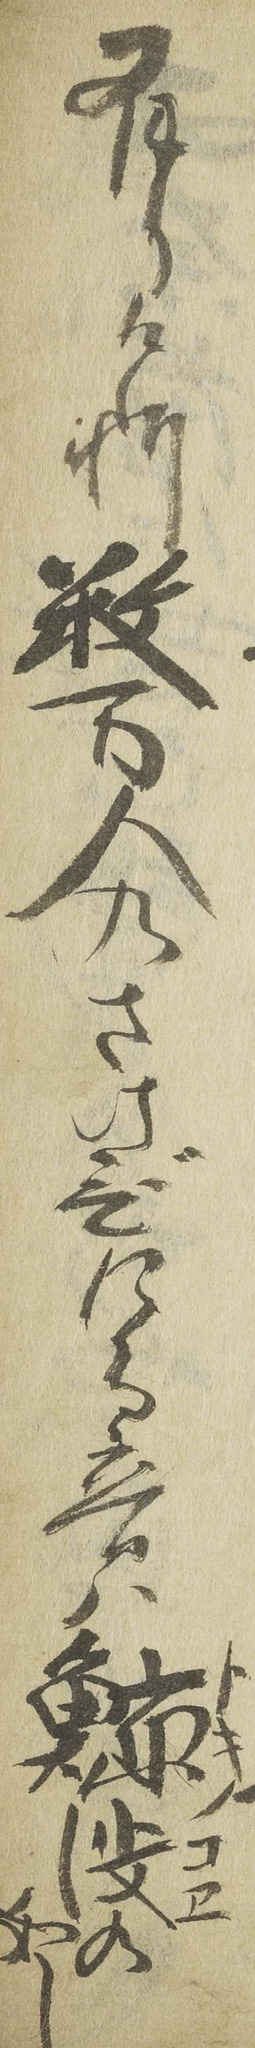有りけり数万人のさけびける音は鯨波の如し

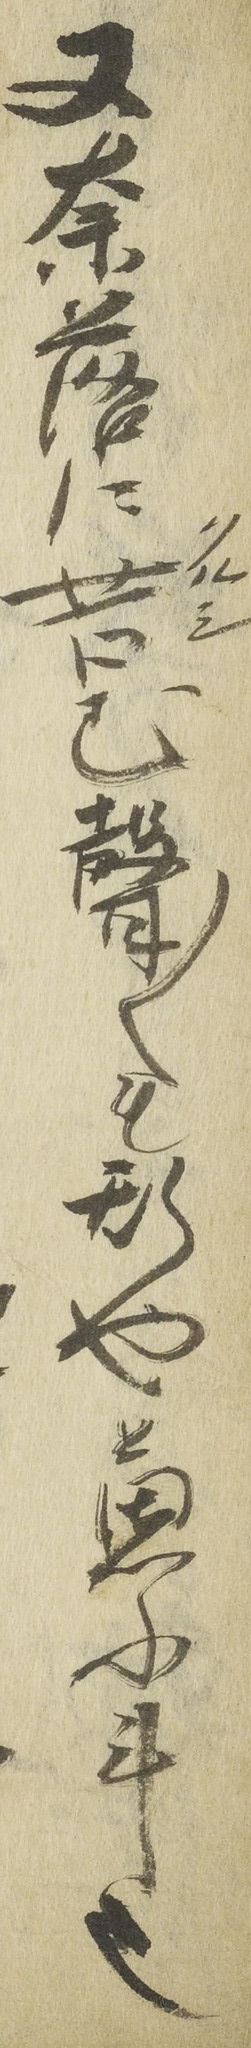又奈落に苦む声〳〵も斯や思ふ斗也
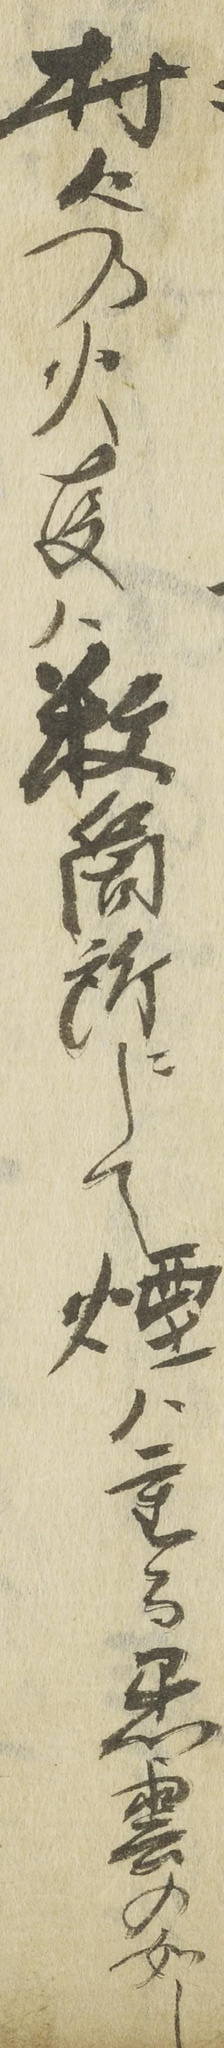村々の火事は数箇所ニして煙は重る黒雲の如し
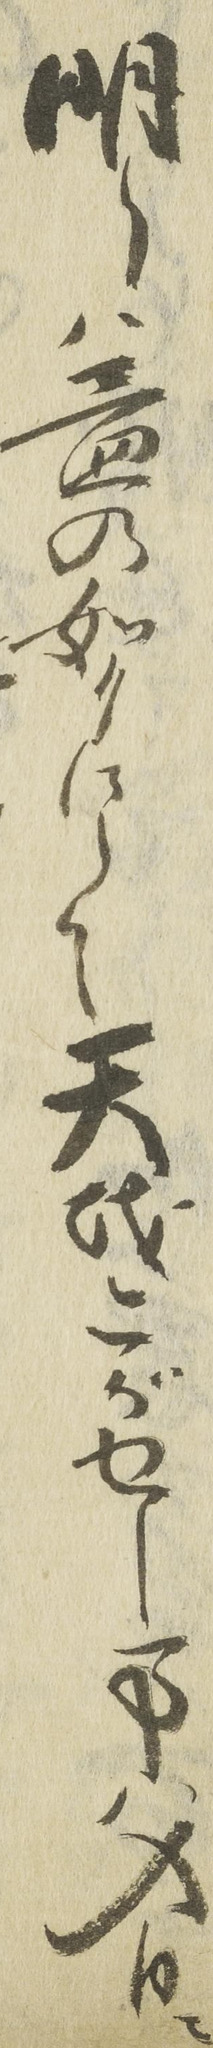明りは昼の如くにして天をこがせし事は入日ニ
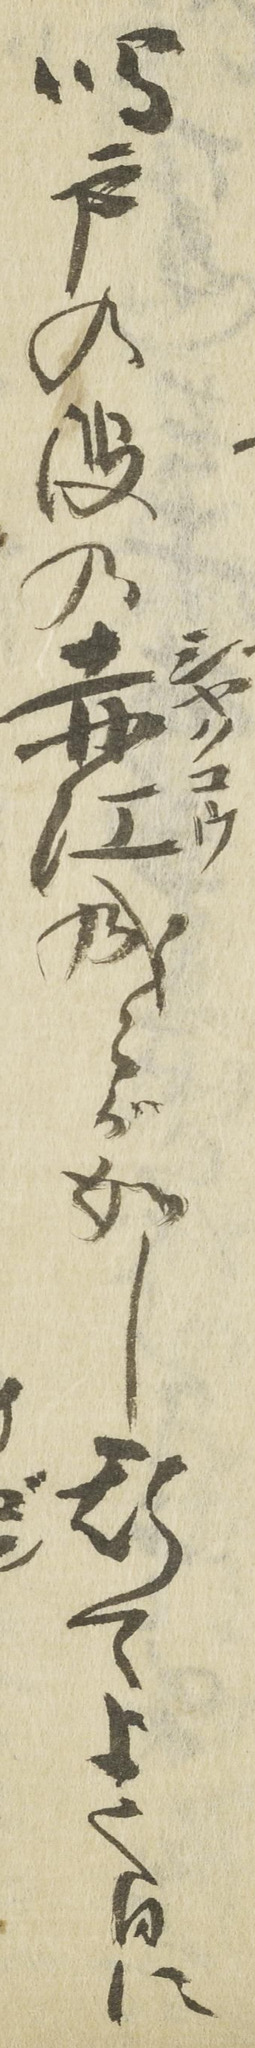鳴戸の波の赤江成るが如し斯てよく日に
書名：善光寺地震聞書
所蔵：東京大学地震研究所図書室 Earthquake Research Institute Library, The University of Tokyo, JAPAN
